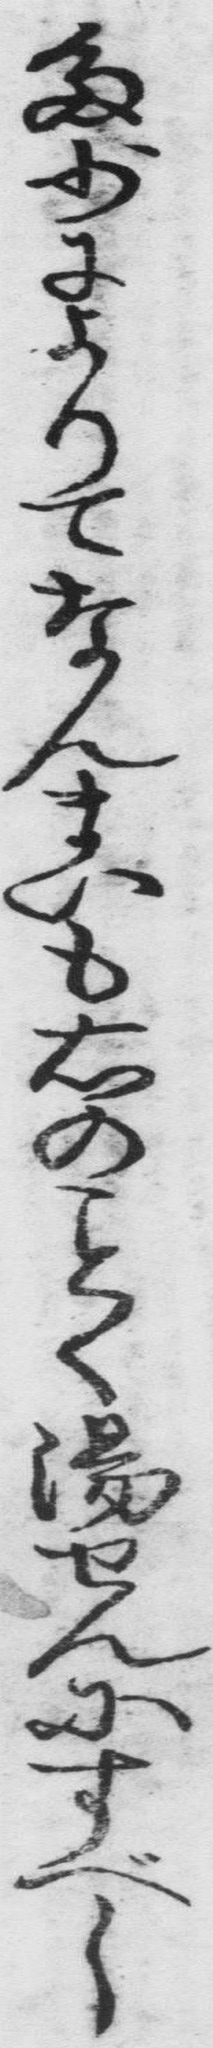多少尓よりてなんまいも右のことく湯せん尓すべし
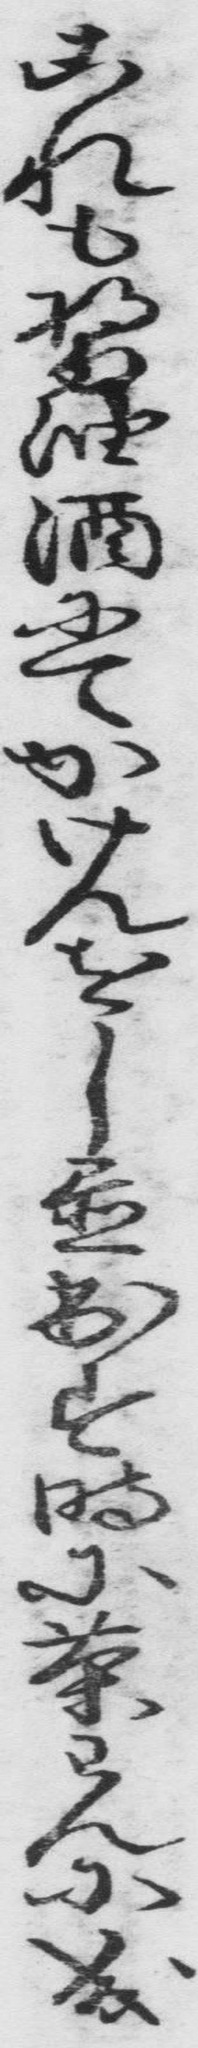古れも醤油酒尓てかけんをし置出春時尓茶わん尓成
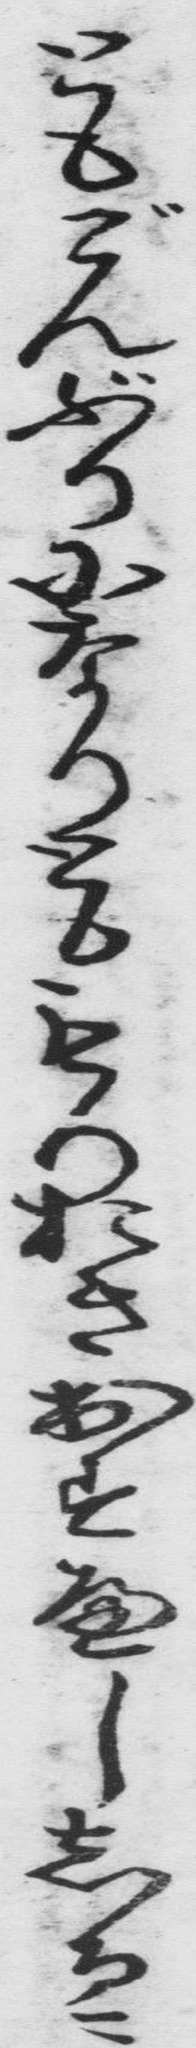ともどんぶり尓なりとももり於き出春扁し志るに
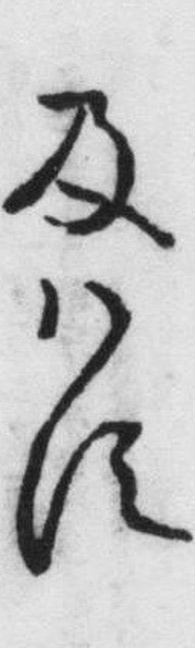及は須
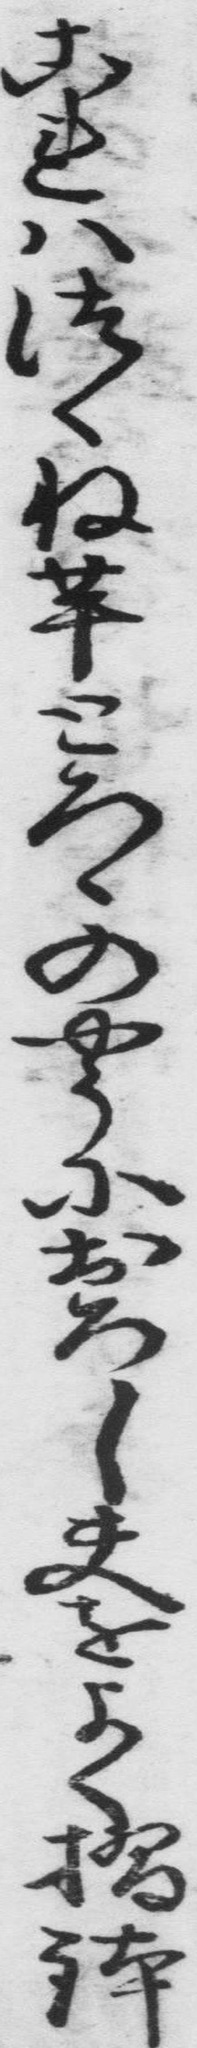古連は徒くね芋とろゝのやう尓おろし夫をよく摺鉢
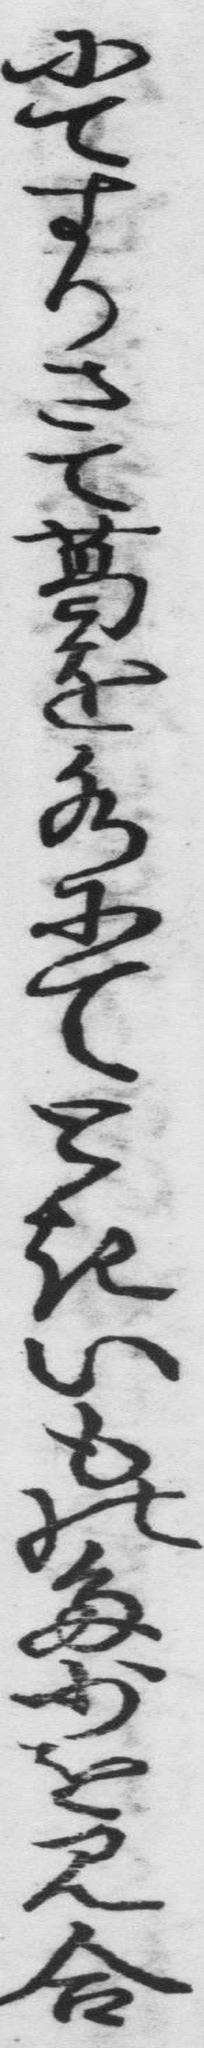尓てすりさて葛を水尓てと起いも能多少を見合
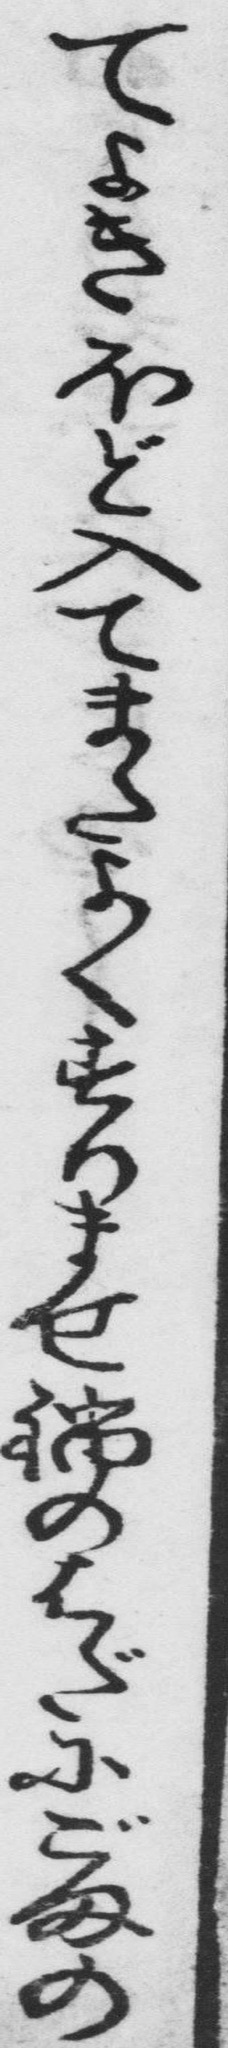てよき不ど入てまたよく春りませ鍋のはだ尓ご満の
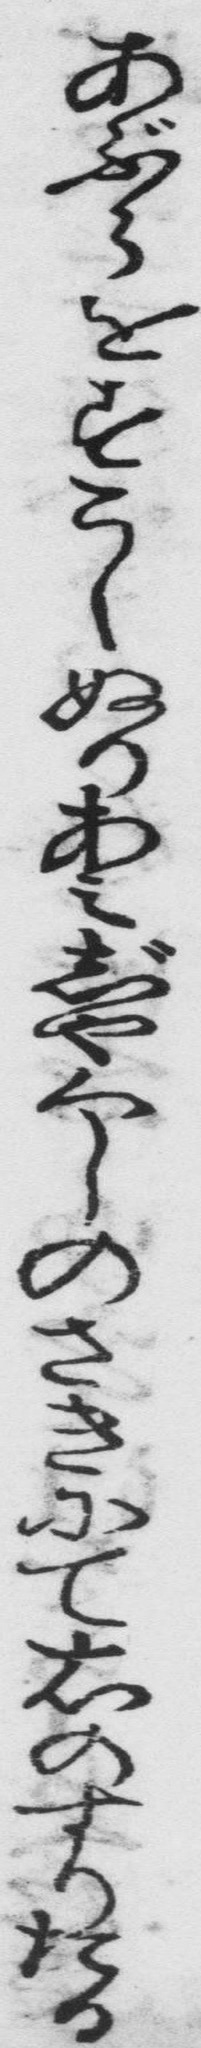あぶらを春こしぬりあみじやくしのさき尓て右のすりたる
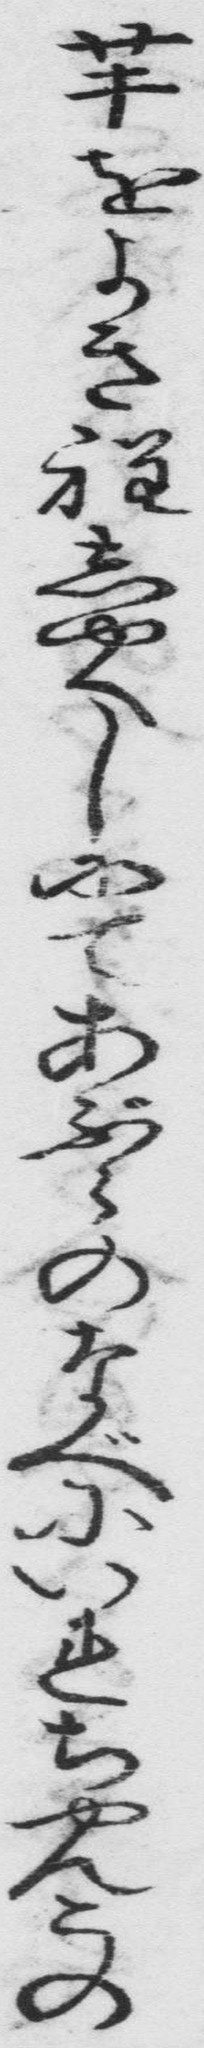芋をよき程志やくし尓てあぶらのなべ尓い連ちやんこの
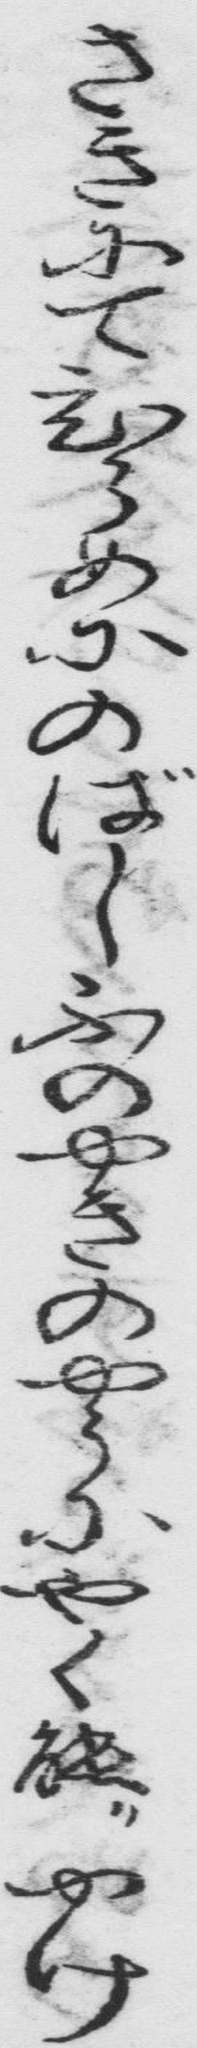さき尓て飛らめ尓のばしふのやきのやう尓やく能くやけ
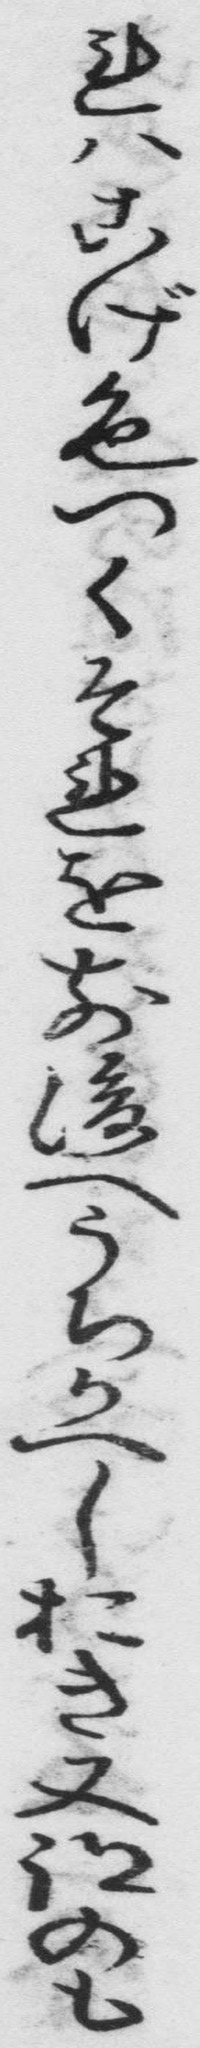連は古げ色つくそ連を前後へうちかへし於き又跡のも
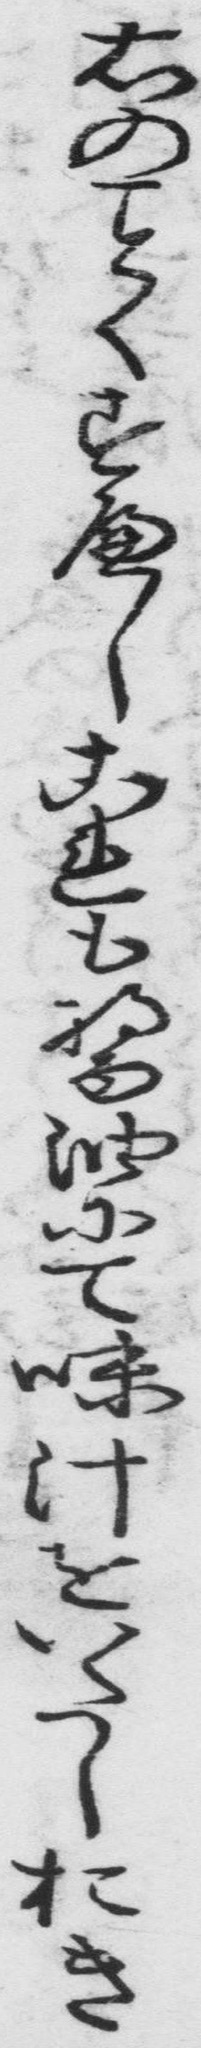右のことく春扁し古連も醤油尓て味汁をいたし於き
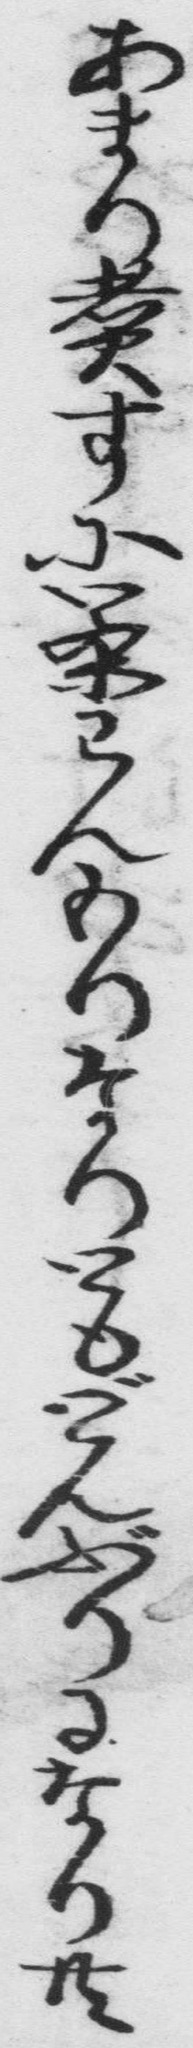あまり煮す尓茶わんもりなりともどんぶり尓なり共
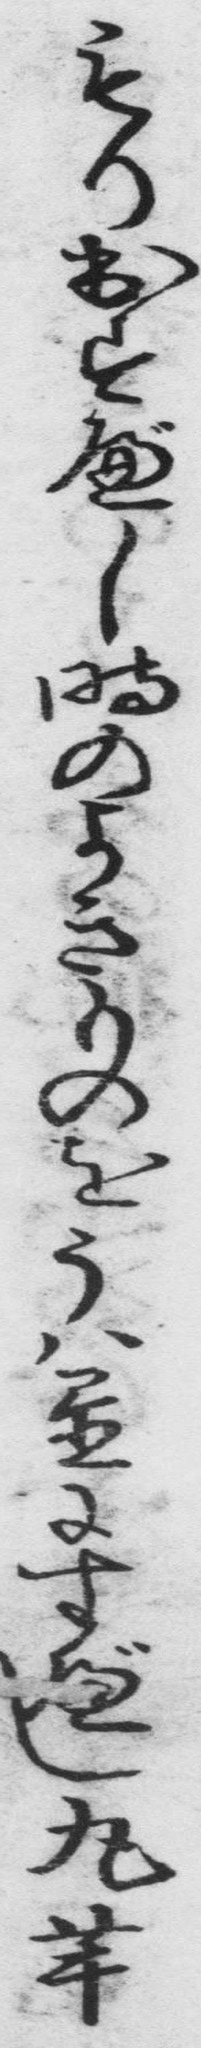もり出春扁し時のよきものをうは置尓すべし丸芋
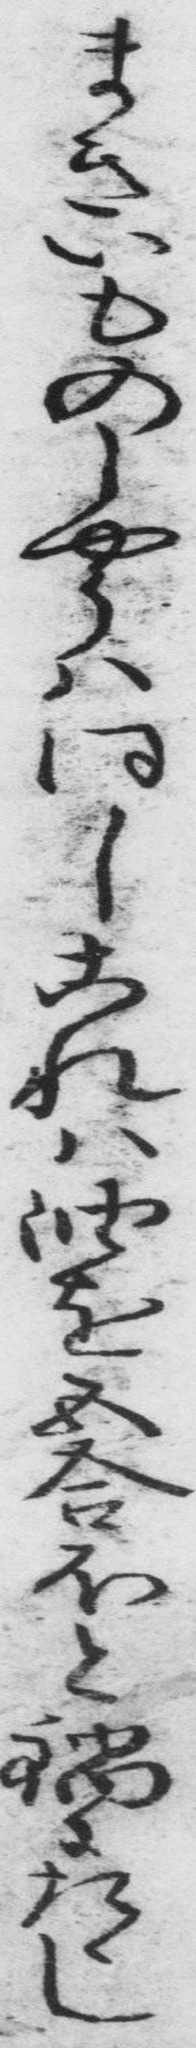まきいものしやうは同し古れは油を五合不と鍋尓たゝし
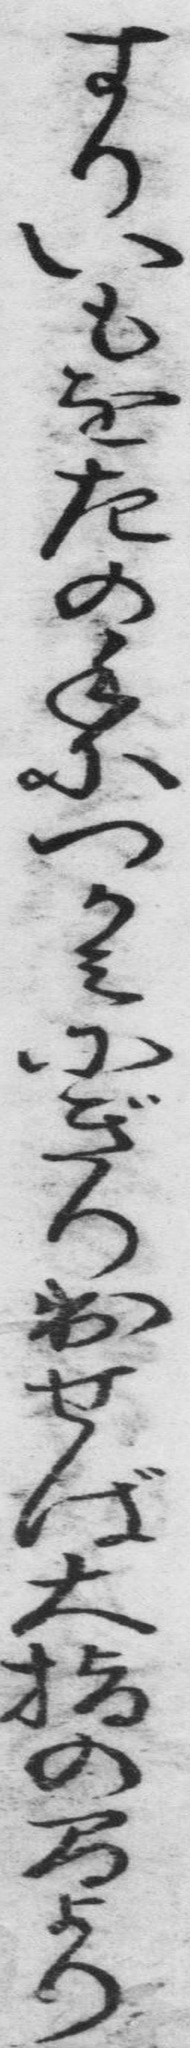すりいもを左の手尓つかみ尓ぎり出せば大指の間より
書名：普茶料理抄
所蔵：大阪府立大学学術情報センター 国文学研究資料館
